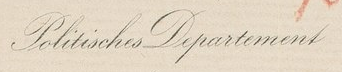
Politisches Departement
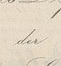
der
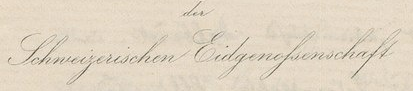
Schweizerischen Eidgenossenschaft
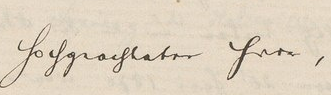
Hochgeachteter Herr,
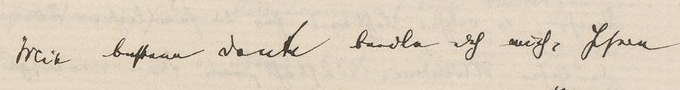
Mit bestem Dank beeile ich mich, Ihnen
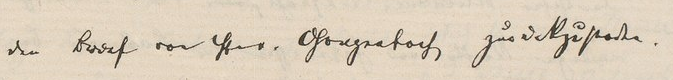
den Brief von H v. Gonzenbach zurückzusenden.
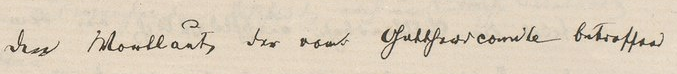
Den Wortlaut der vom Gotthard comite betreffend
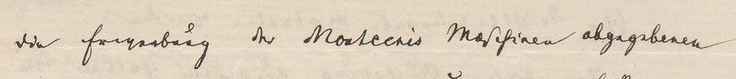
die Erwerbung der Montcenis Maschinen abgegebenen
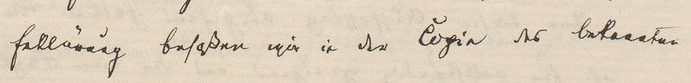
Erklärung besaßen wir in der Copie des bekannten
